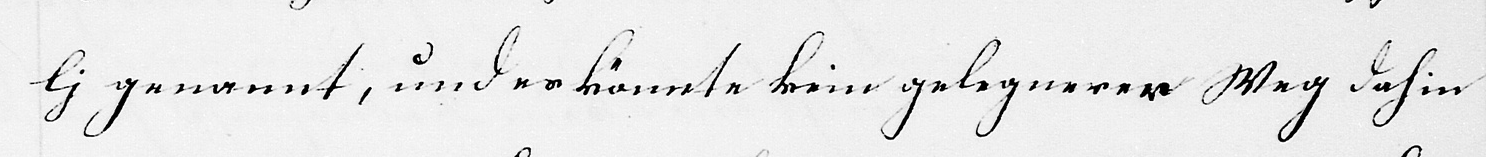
li genannt, und es könnte kein gelegnerer Weg dahin
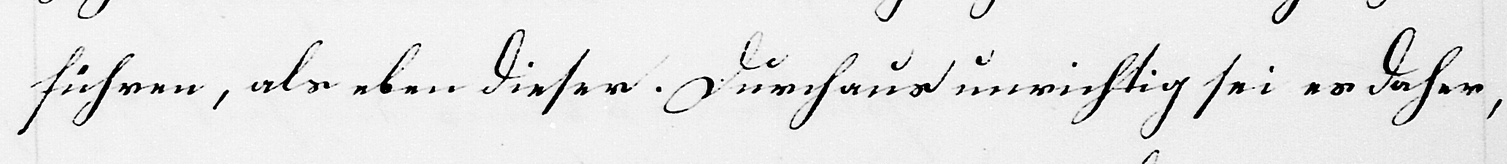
führen, als eben dieser. Durchaus unrichtig sei es daher,
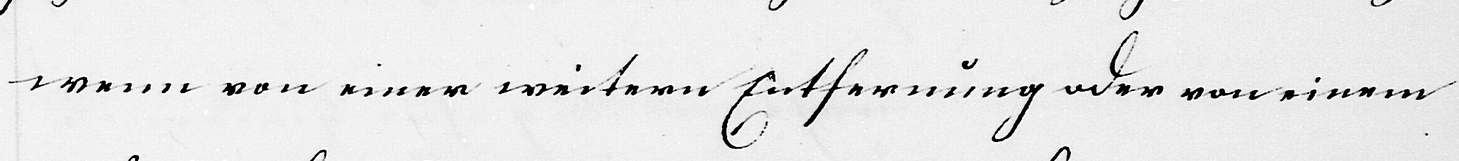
wenn von einer weitern Entfernung oder von einem
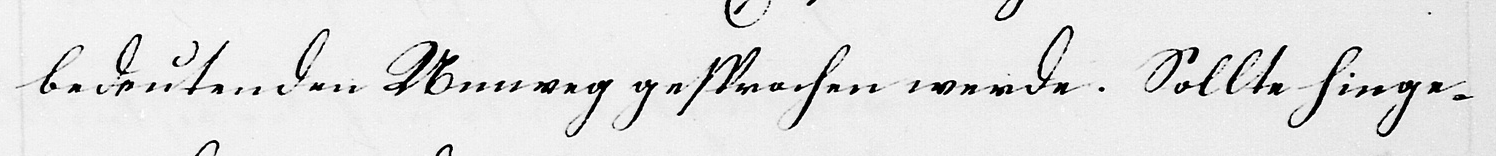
bedeutenden Umweg gesprochen werde. Sollte hinge¬
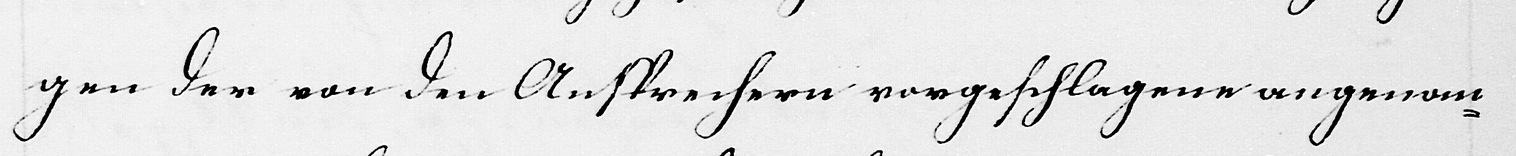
gen der von den Ansprechern vorgeschlagene angenom¬
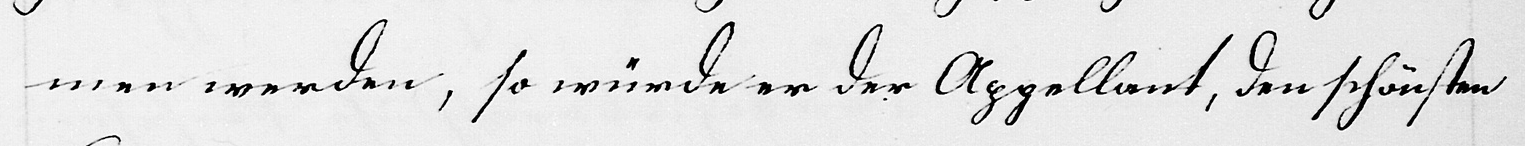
men werden, so würde er der Appellant, den schönsten
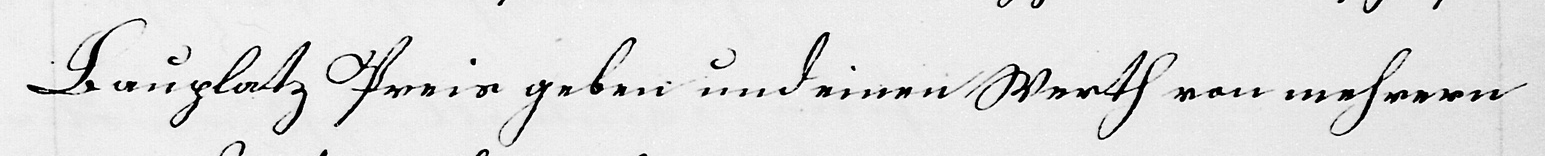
Bauplatz Preis geben und einen Werth von mehrern
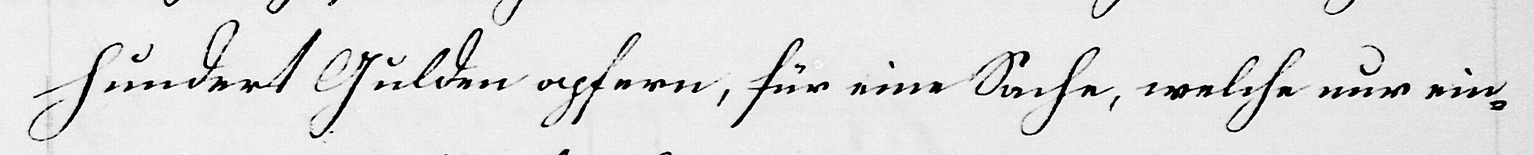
hundert Gulden opfern, für eine Sache, welche nur ein¬
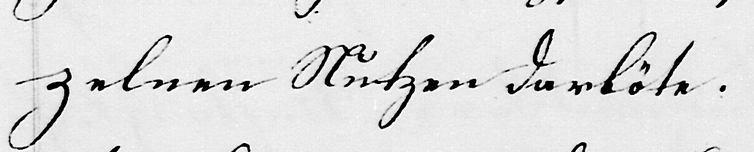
zelnen Nutzen darböte.
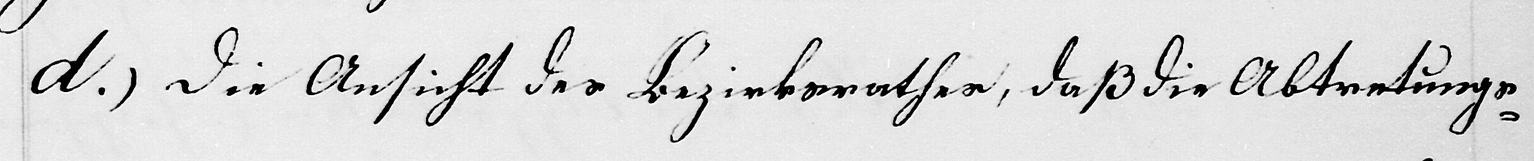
d.) Die Ansicht des Bezirksrathes, daß die Abtretungs-
